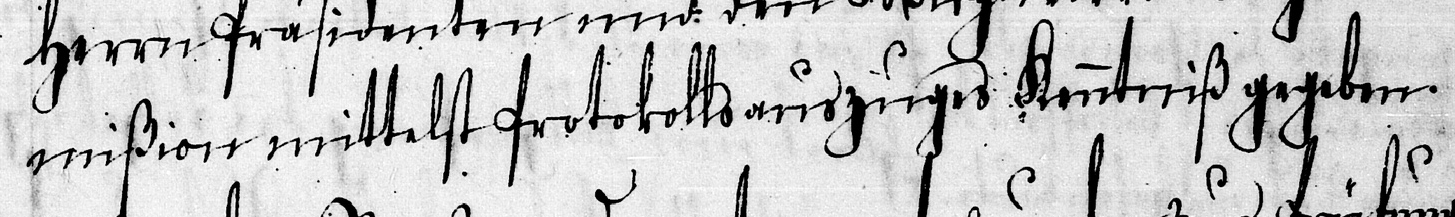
mißion mittelst Protokollsauszuges Kenntniß gegeben.
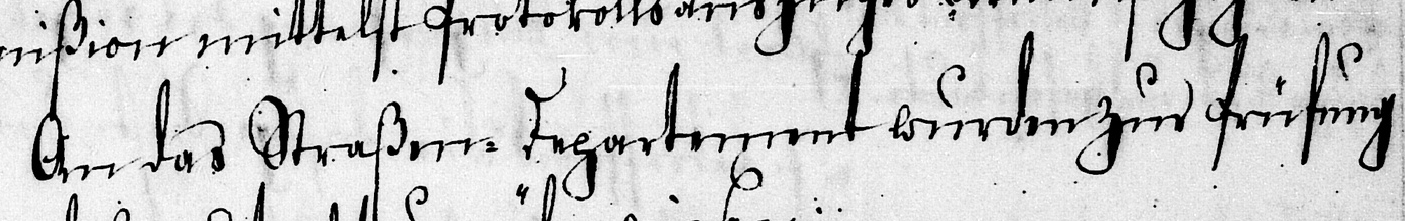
An das Straßen-Departement wurden zur Prüfung
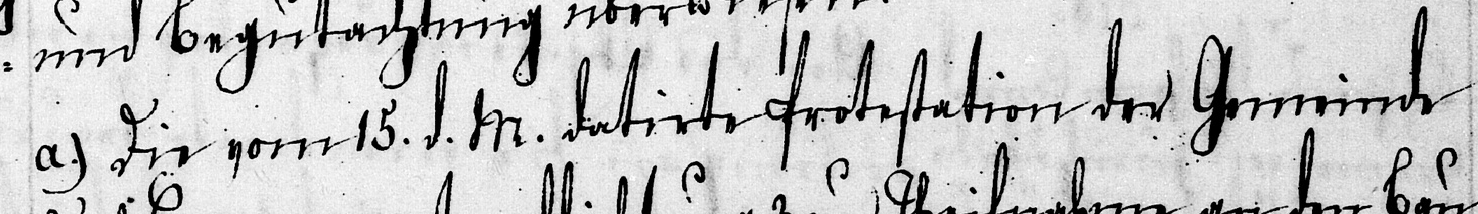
a.) Die vom 15. d. M. datirte Protestation der Gemeinde
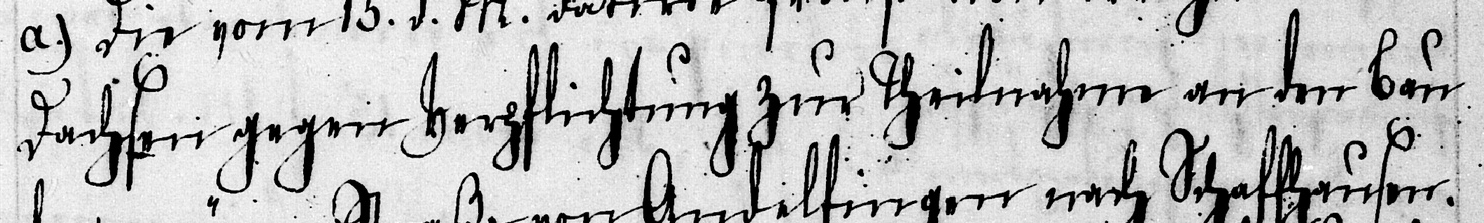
Dachsen gegen Verpflichtung zur Theilnahme an den Bau
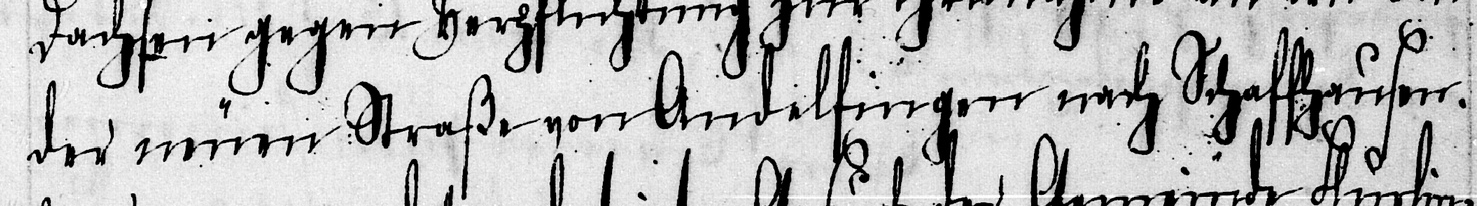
der neuen Straße von Andelfingen nach Schaffhausen.
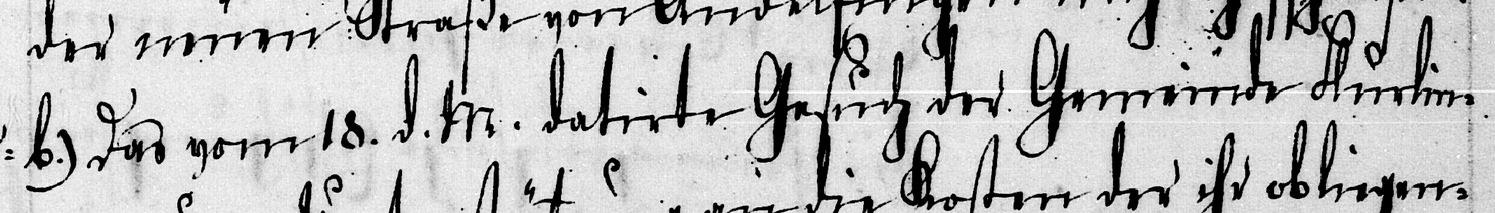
b.) Das vom 18. d. M. datirte Gesuch der Gemeinde Flurlin¬
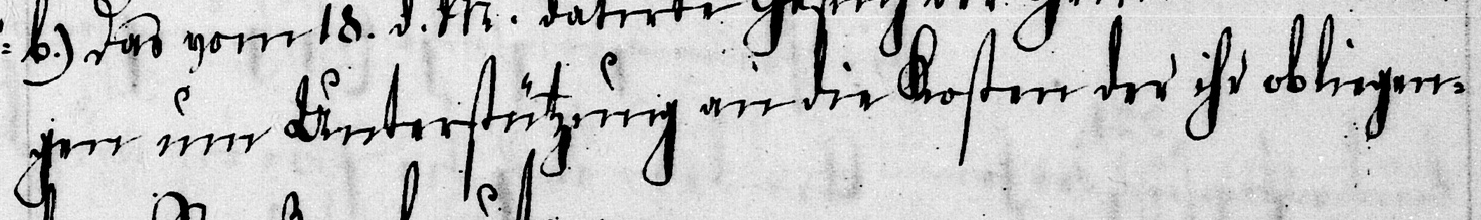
gen um Unterstützung an die Kosten der ihr obliegen¬
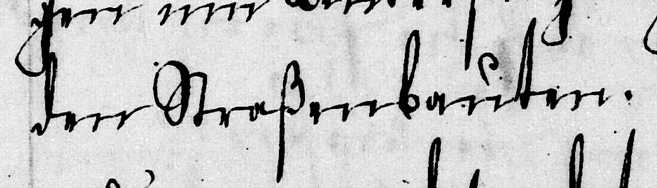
den Straßenbauten.
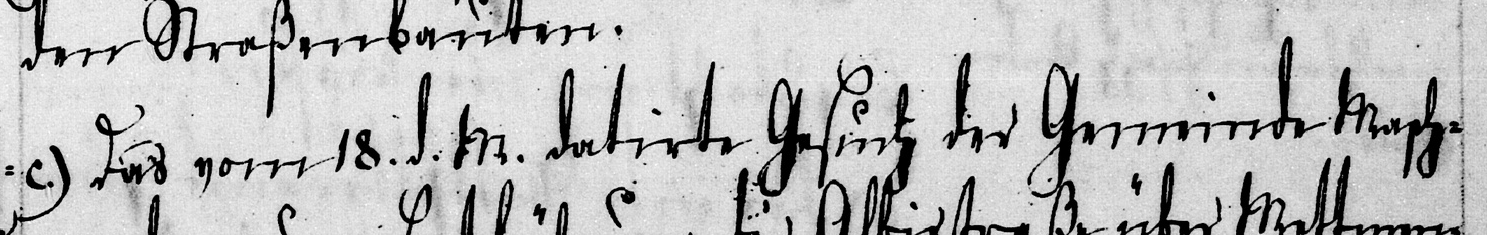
c.) Das vom 18. d. M. datirte Gesuch der Gemeinde Masch¬
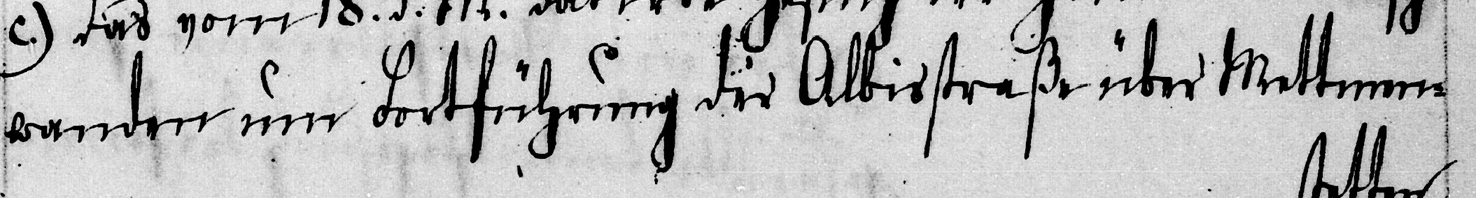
wanden um Fortführung der Albisstraße über Mettmen-
